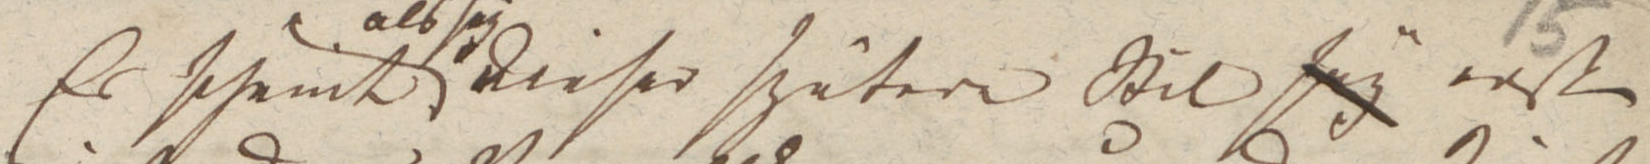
Es scheint als sey dieser spätere Stil sey erst
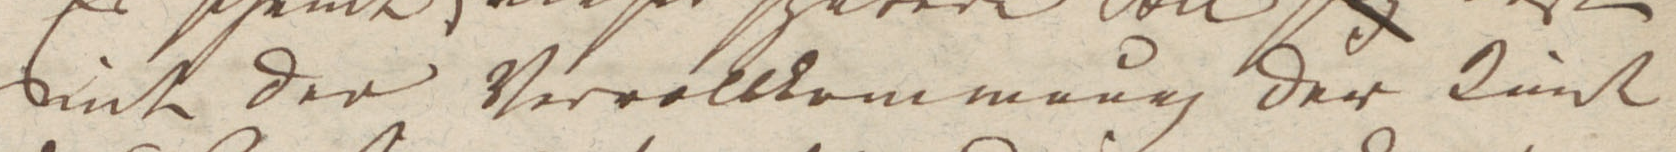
mit der Vervollkommung der Kunst
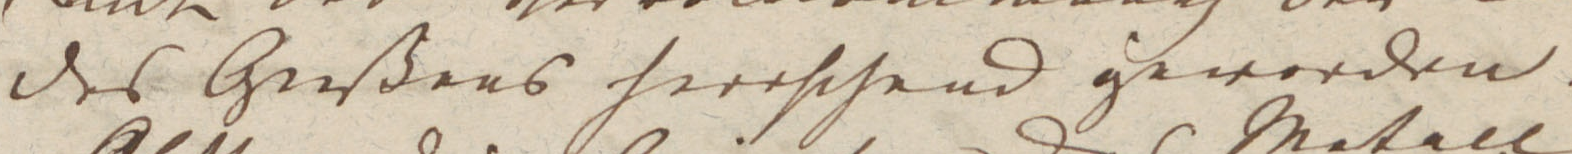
des Giessens herrschend geworden.
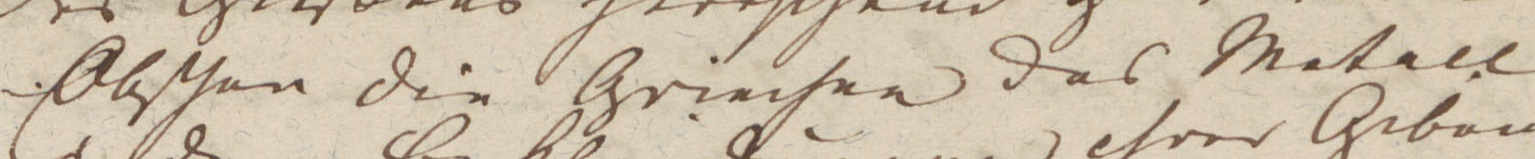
EObschon die Griechen das Metall
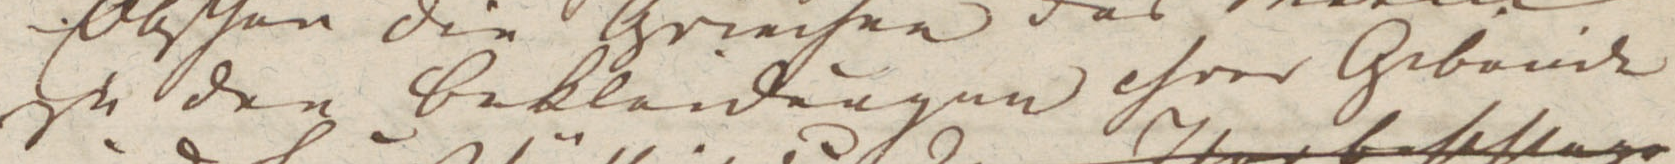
zu den Bekleidungen ihrer Gebäude
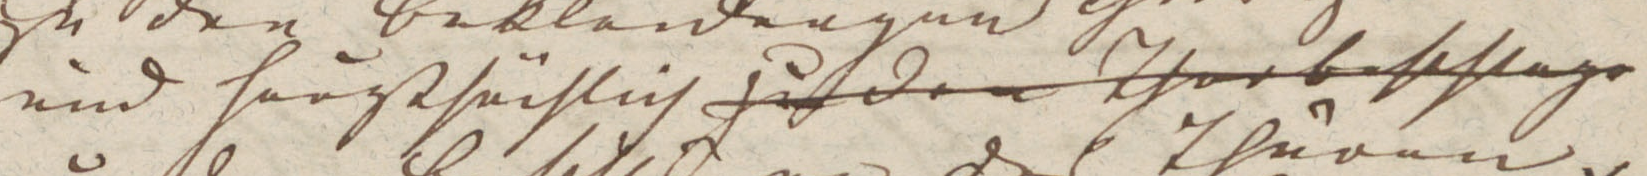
und hauptsächlich zu den Thurbeschlage
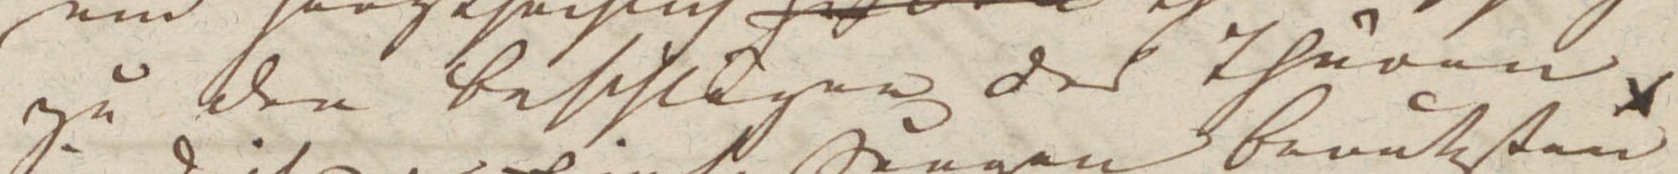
zu den Beschlägen der Thüren
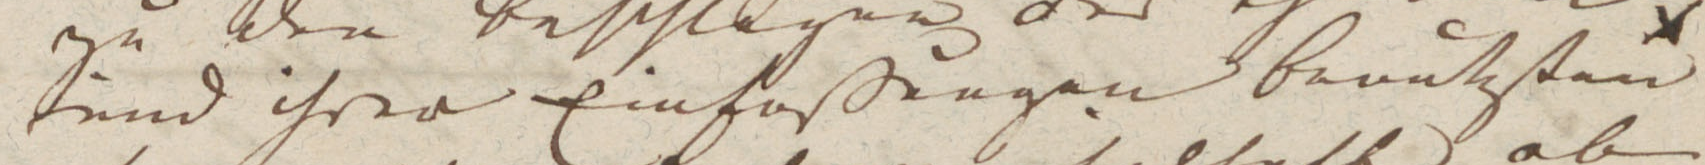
und ihrer Einfassungen benutzten %
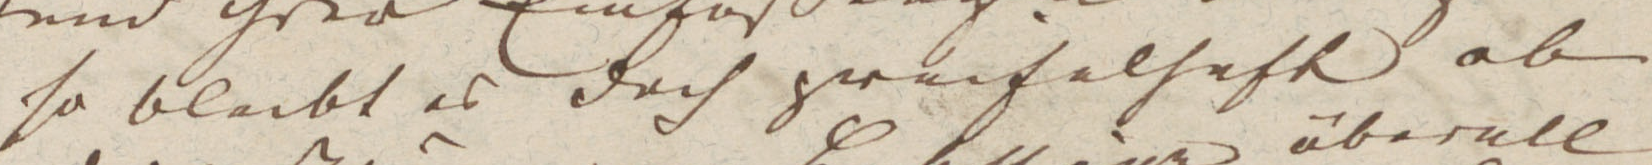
so bleibt es doch zweifelhaft ob
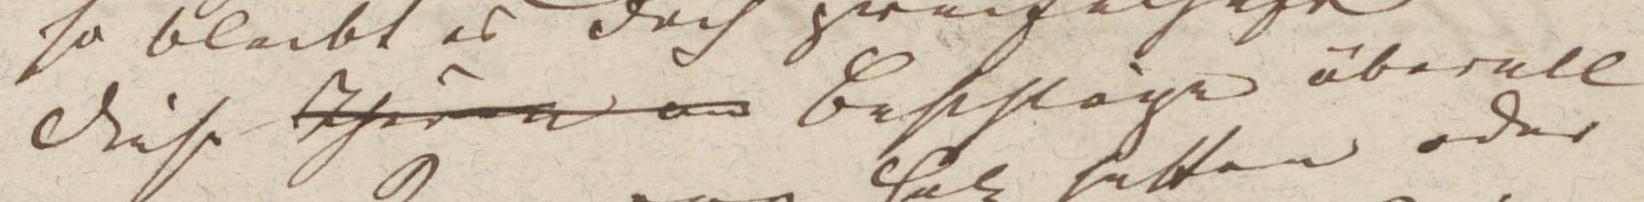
diese Thüren an Beschläge überall
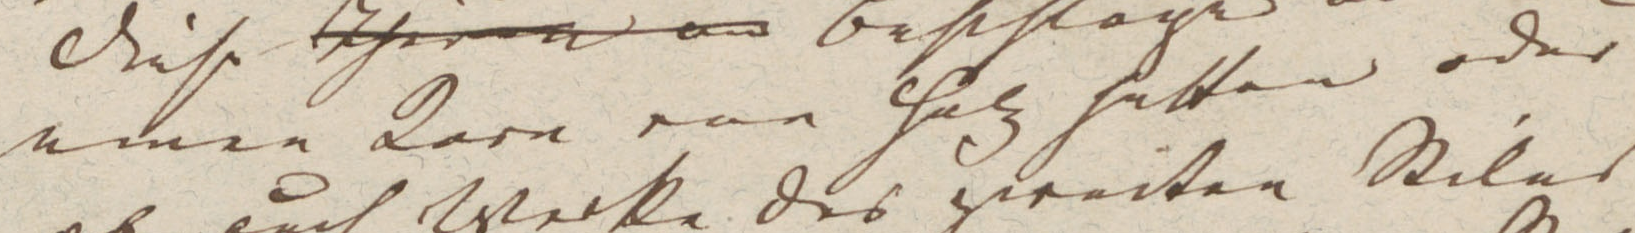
einen Kern von Holz hatten oder
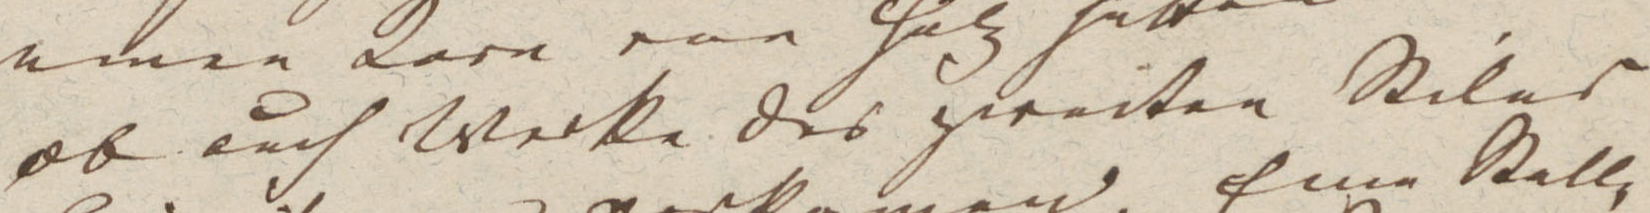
ob auch Werke des zweiten Stiles
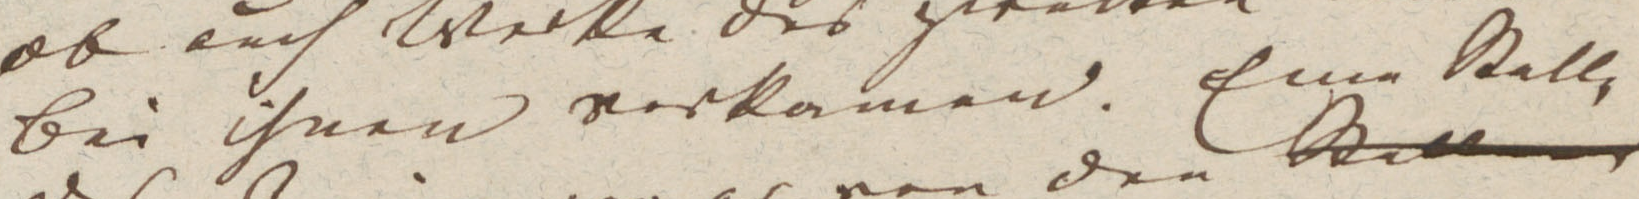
bei ihnen vorkamen. Eine Stelle
